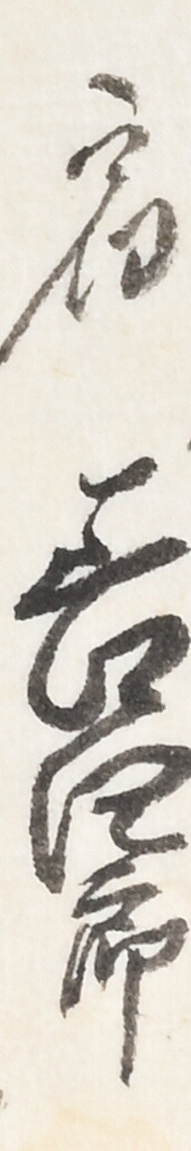宿善四郎
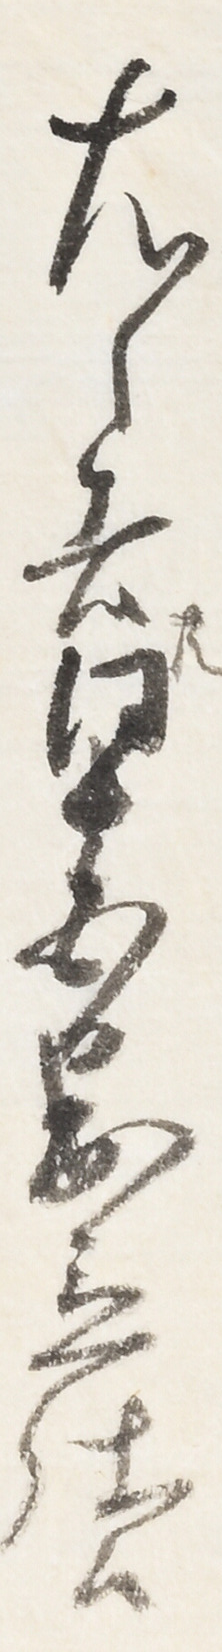右之者同廿一日出立仕候
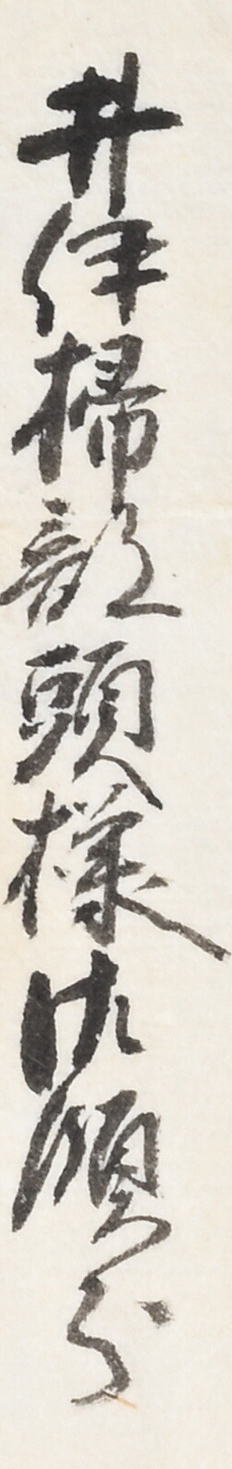井伊掃部頭様御領分
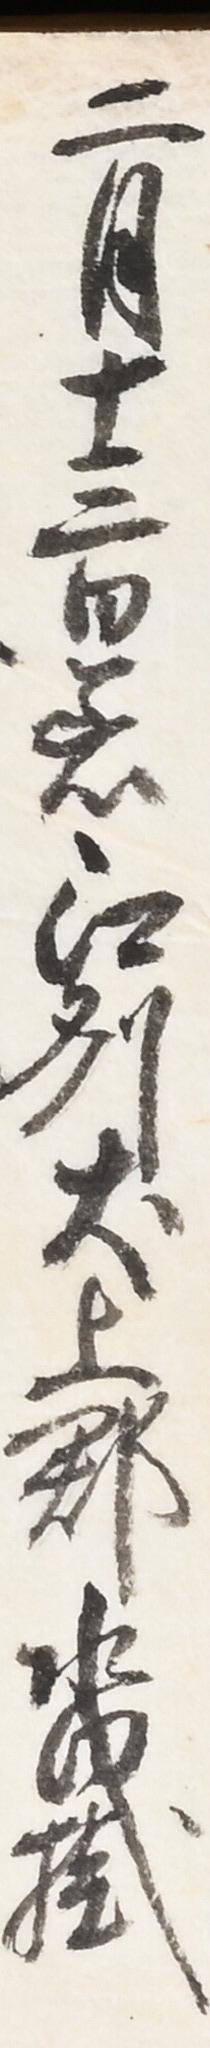弐月十三日着江州犬上郡水田掛
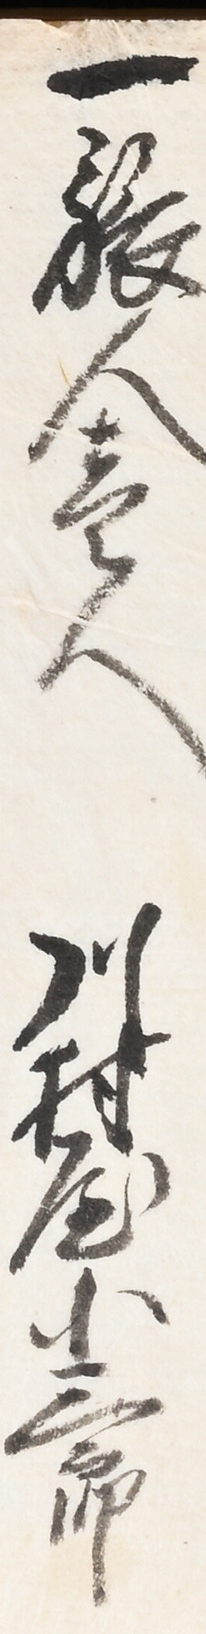一旅人壱人川村屋小三郎
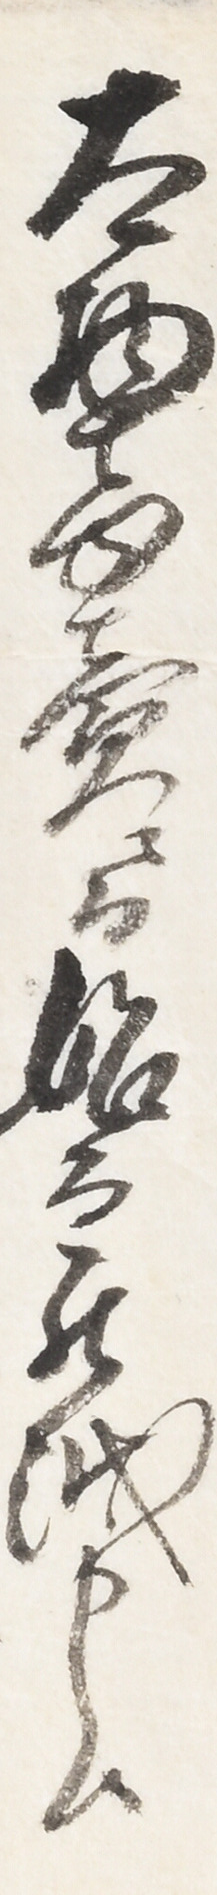太物商売ニ而始而罷越申候
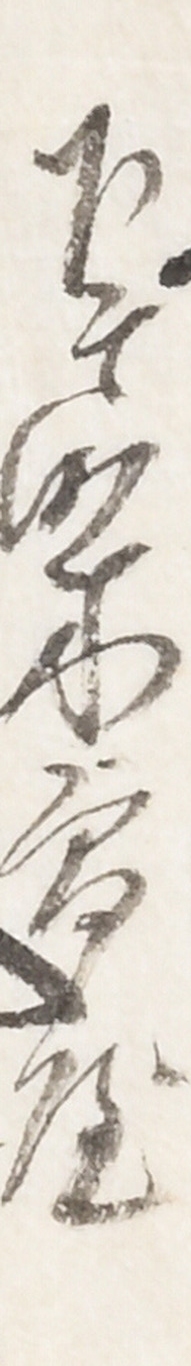下モ町木曽屋
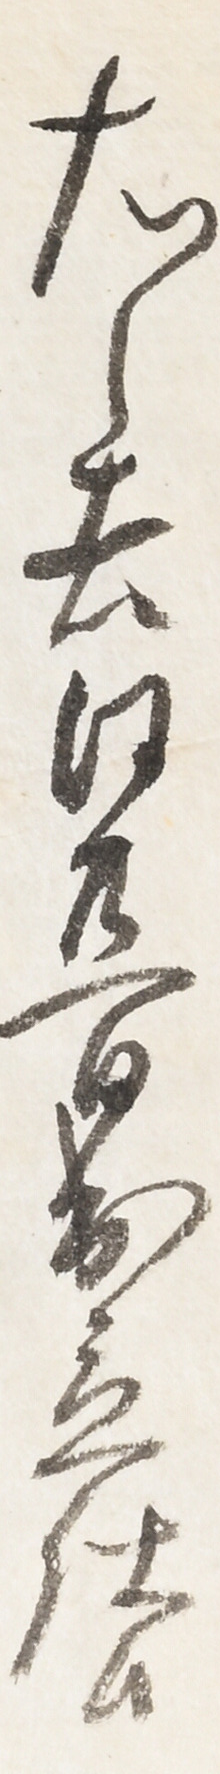右之者同廿一日出立仕候
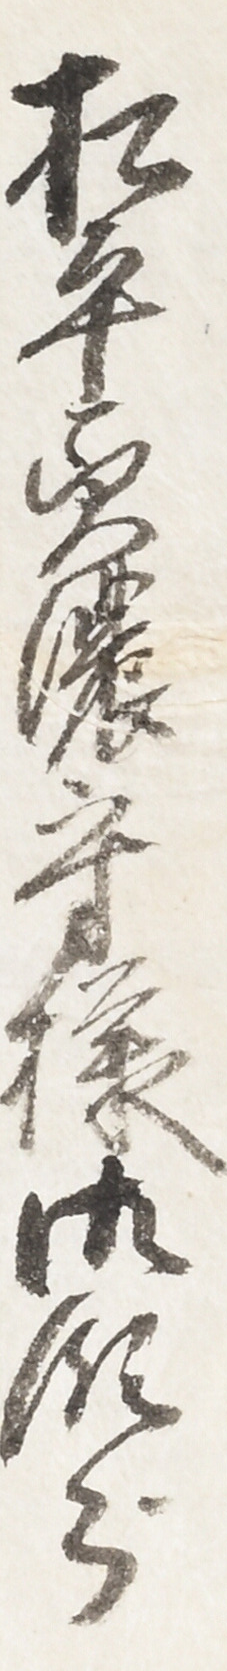松平美濃守様御領分
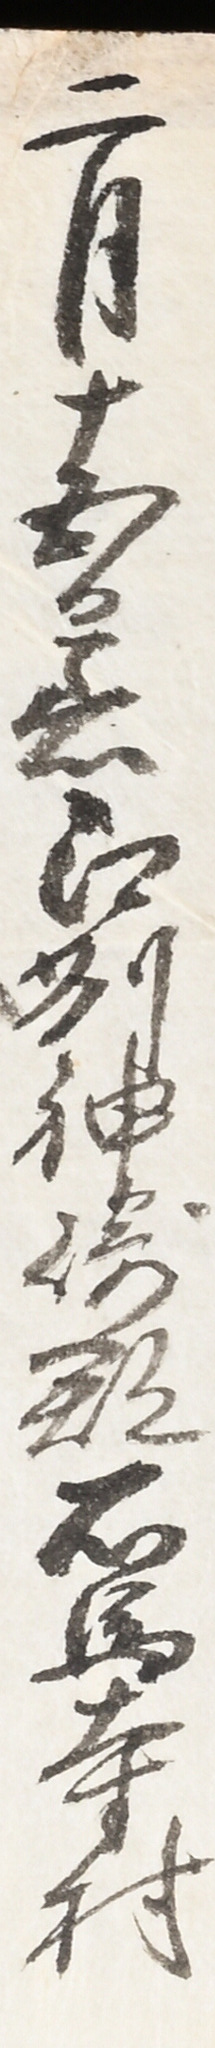二月十五日着江州神崎郡石馬寺村
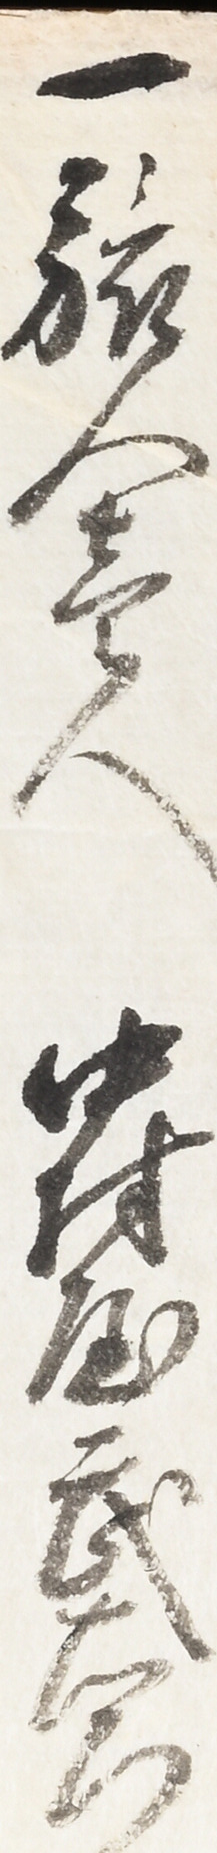一旅人壱人中村屋武右衛門
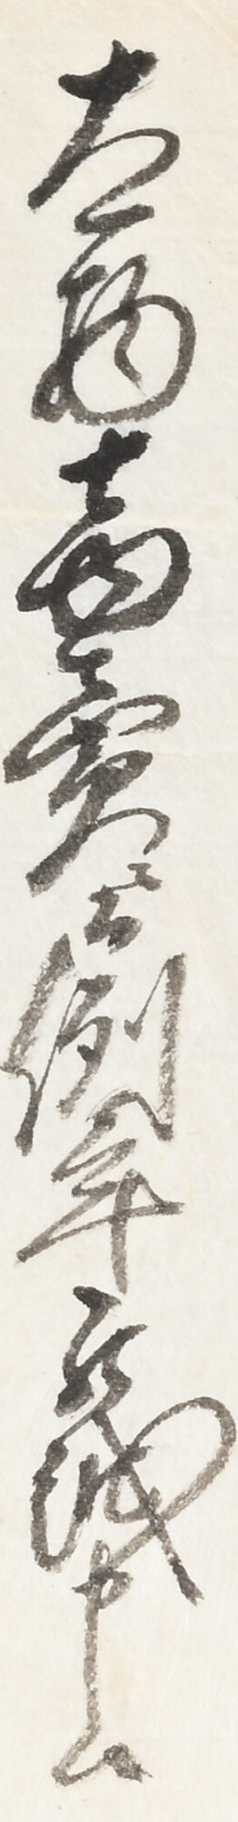太物商売ニ而例年罷越申候
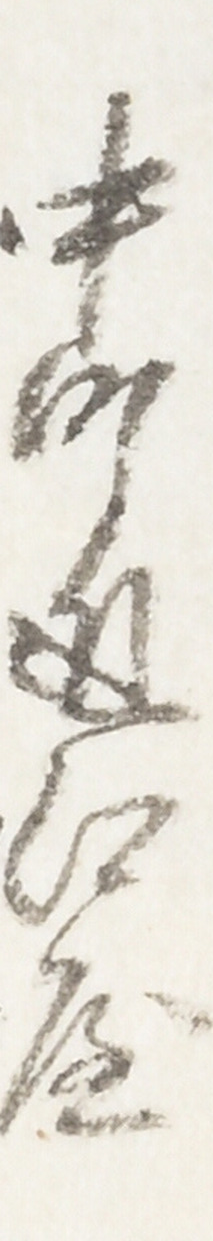中町近江屋
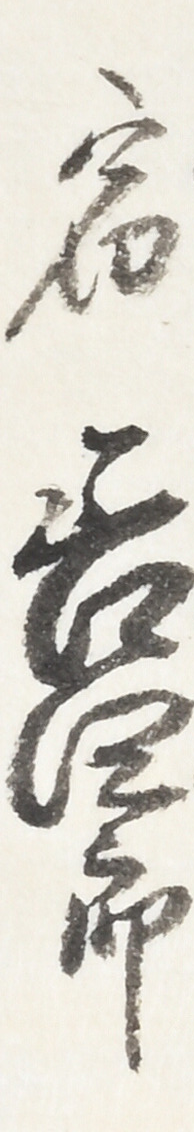宿善四郎
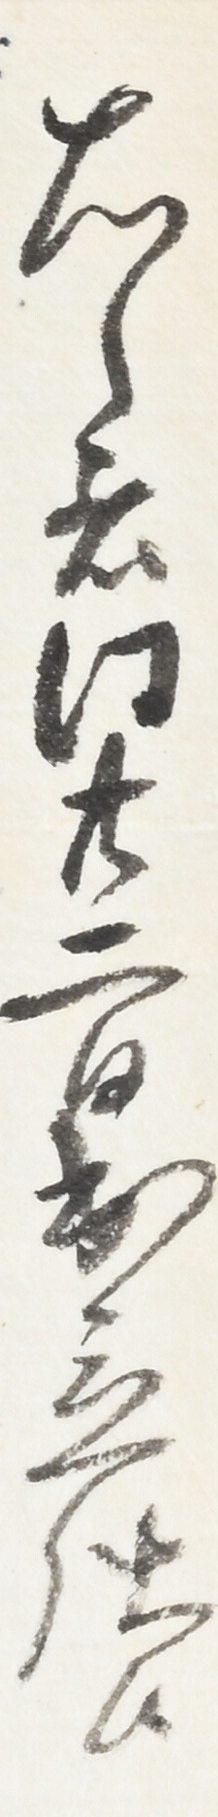右之者同廿二日出立仕候
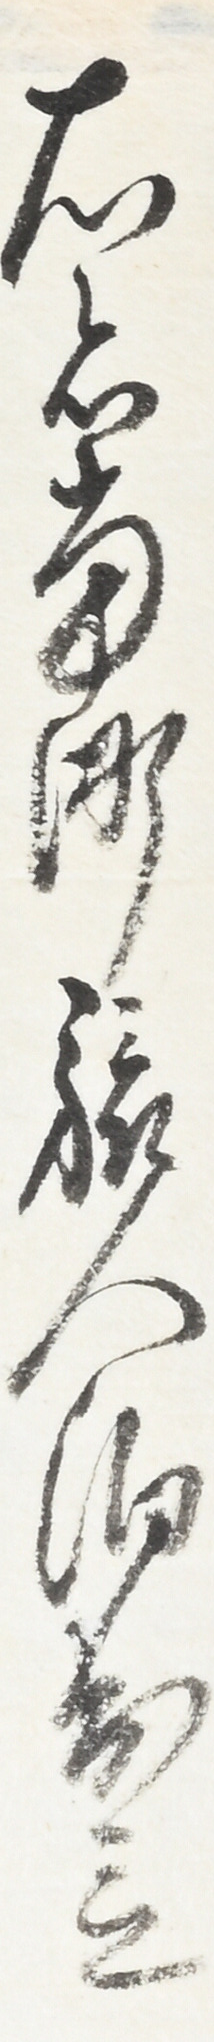右者当町旅人泊出立
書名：旅人泊控帳
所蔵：伊那市立高遠町図書館・合同会社AMANE
